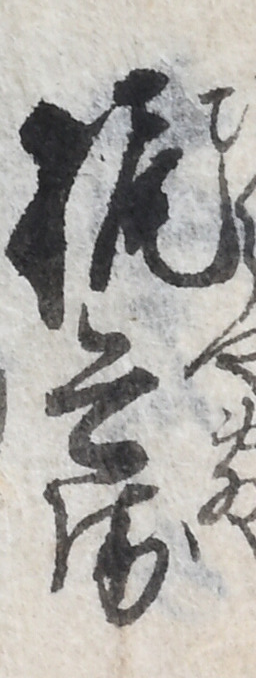茂兵衛
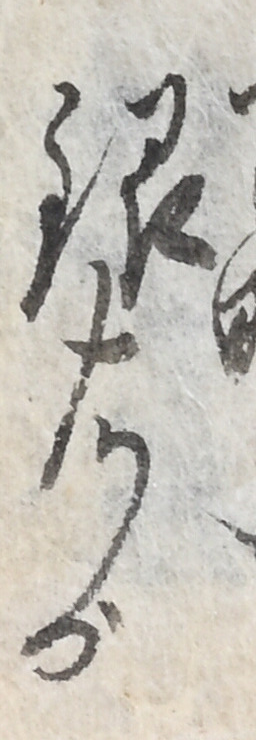作右衛門
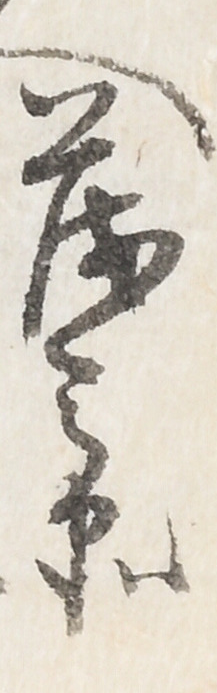茂兵衛
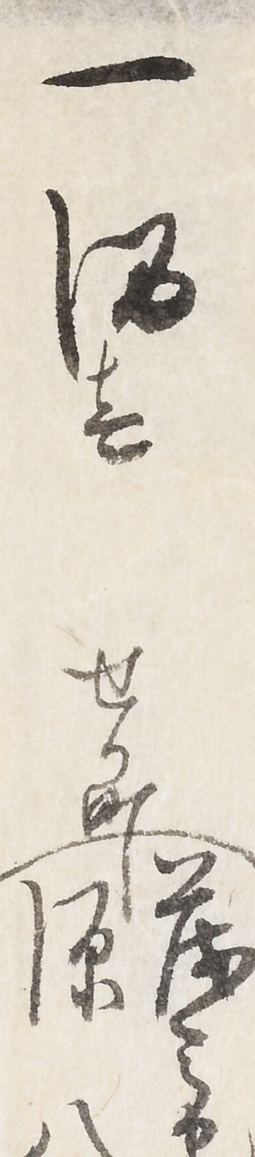一酒壱せり町源八
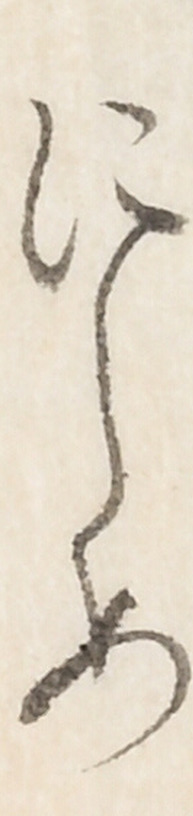にしめ
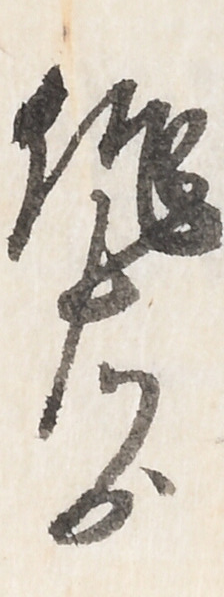作右衛門
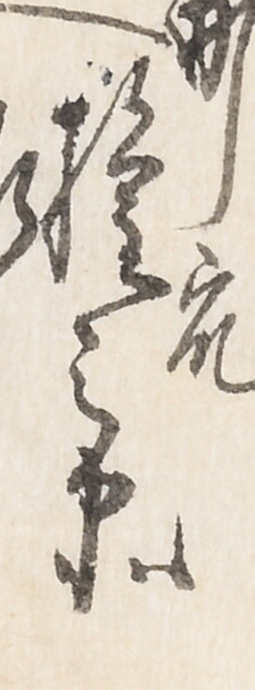権兵衛
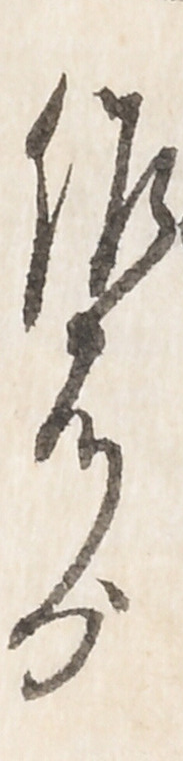作右衛門
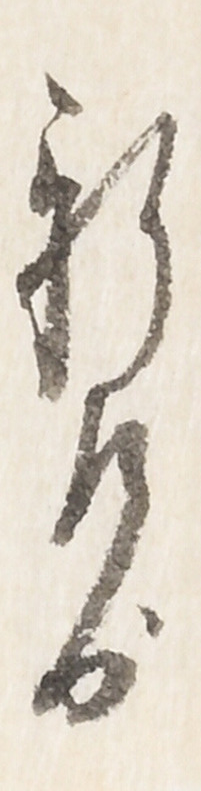新左衛門
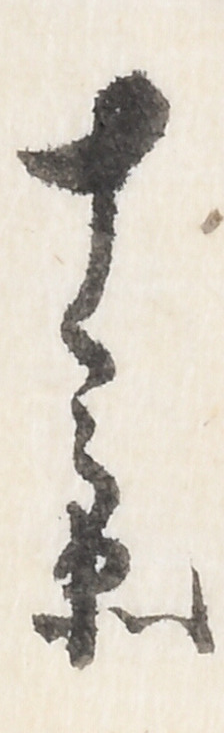十兵衛
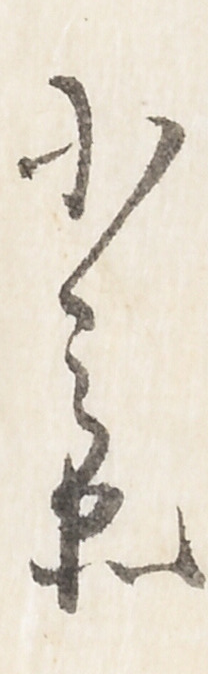小兵衛
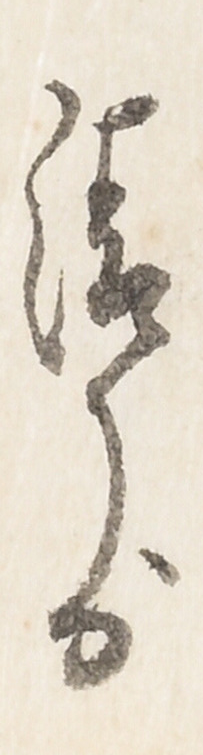茂兵衛
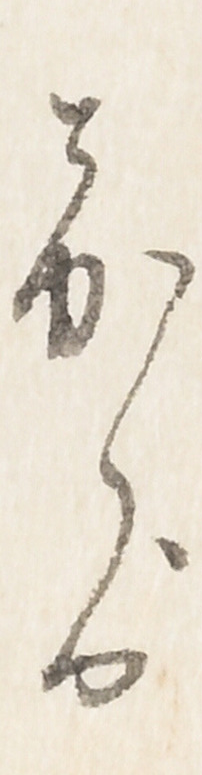茂兵衛
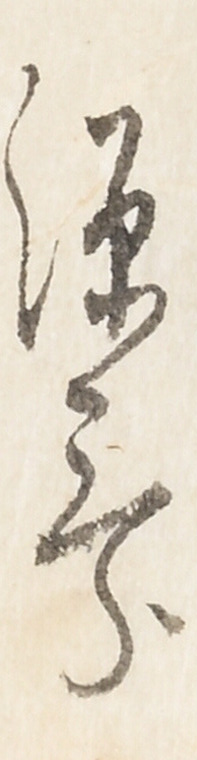源三郎
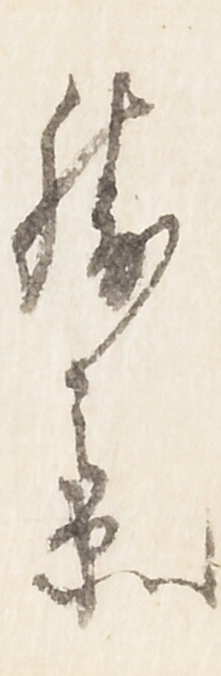勝兵衛
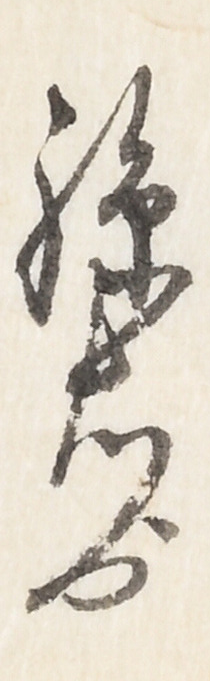作右衛門
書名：合力覚帳
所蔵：伊那市立高遠町図書館・合同会社AMANE
